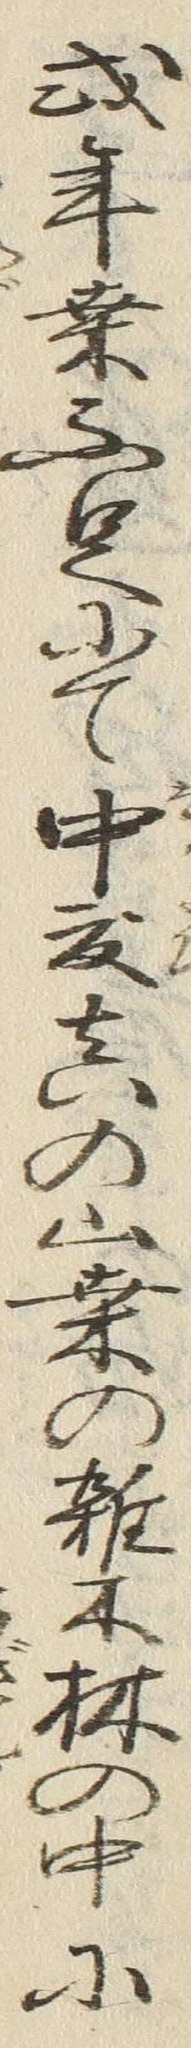或年桑ふ足尓て中度真の山桑の雑木林の中尓
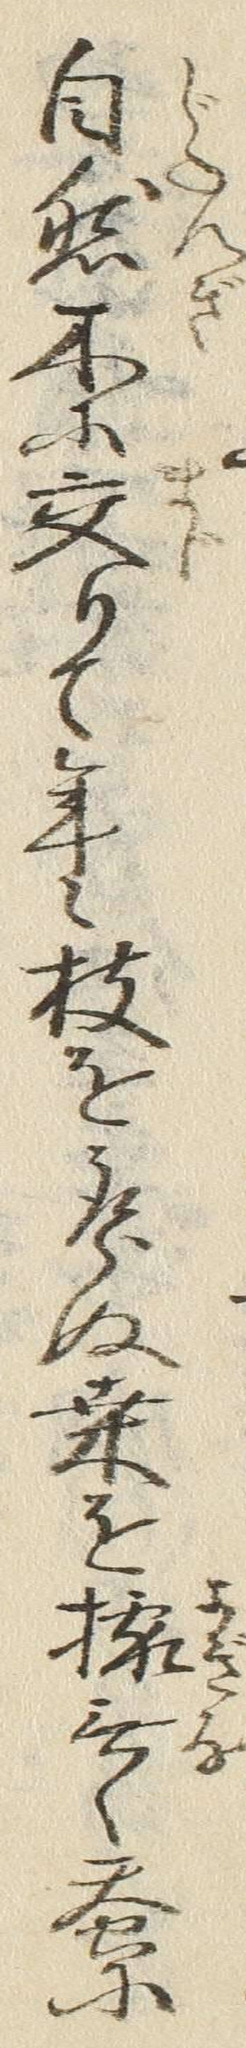自然木尓交りて年々枝を取らぬ桑を據無く蚕尓
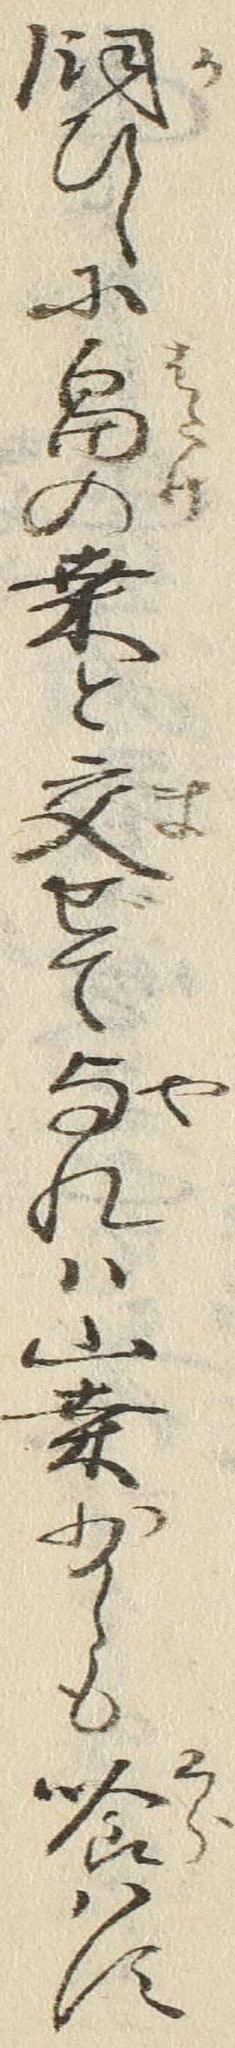飼ひし尓畠の桑と交ぜて与れは山桑少しも喰は須
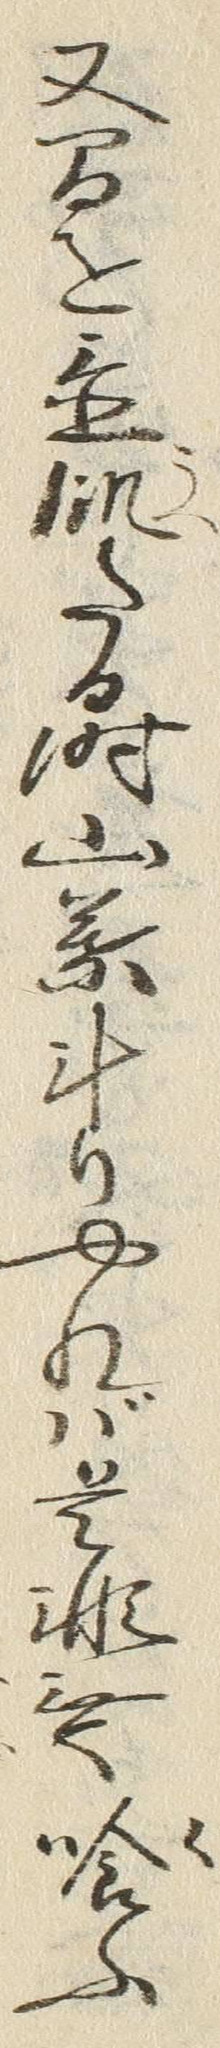又間を置飢たる時山葉斗りやれば是非無く喰ふ
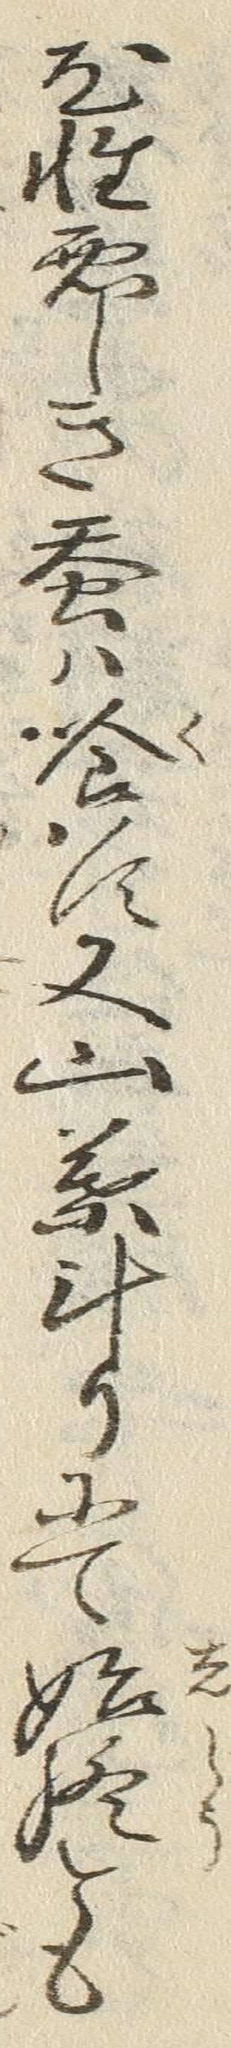尤性悪しき蚕は喰は須又山葉斗り尓て始終とも
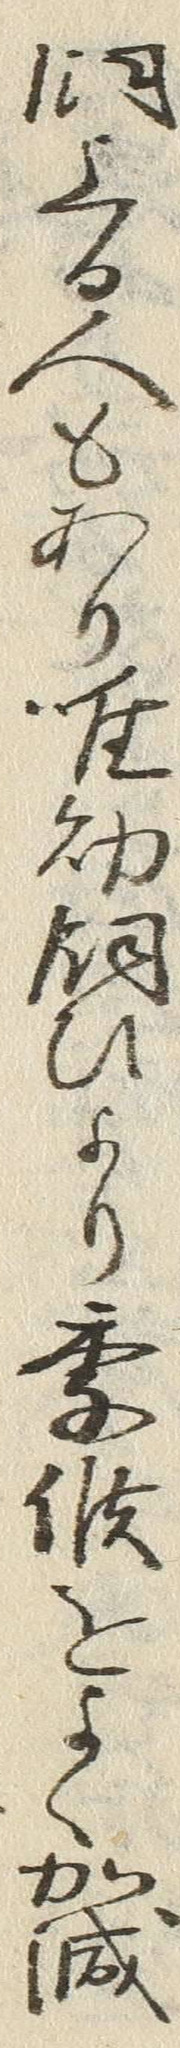飼上る人もあり唯幼飼ひより季候をよく加減
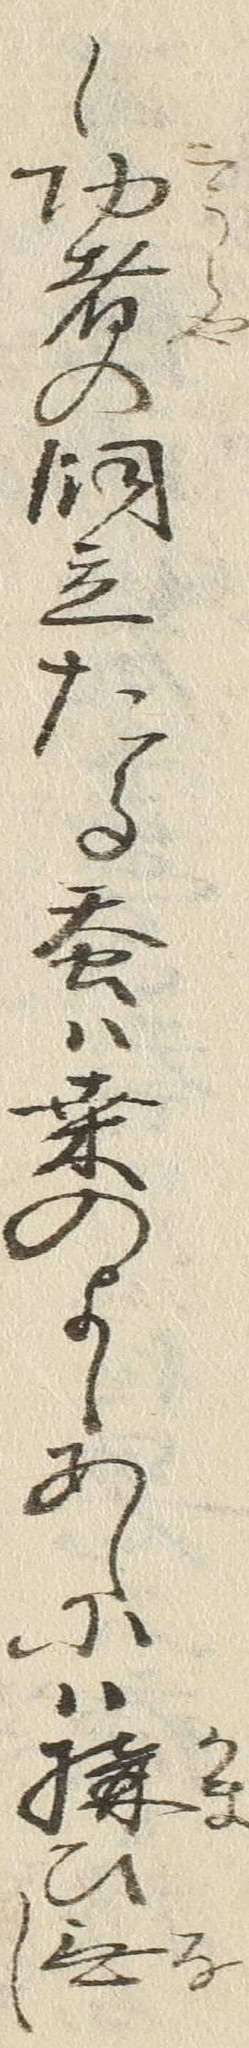し功者の飼立たる蚕は桑のよしあし尓は構ひ無し
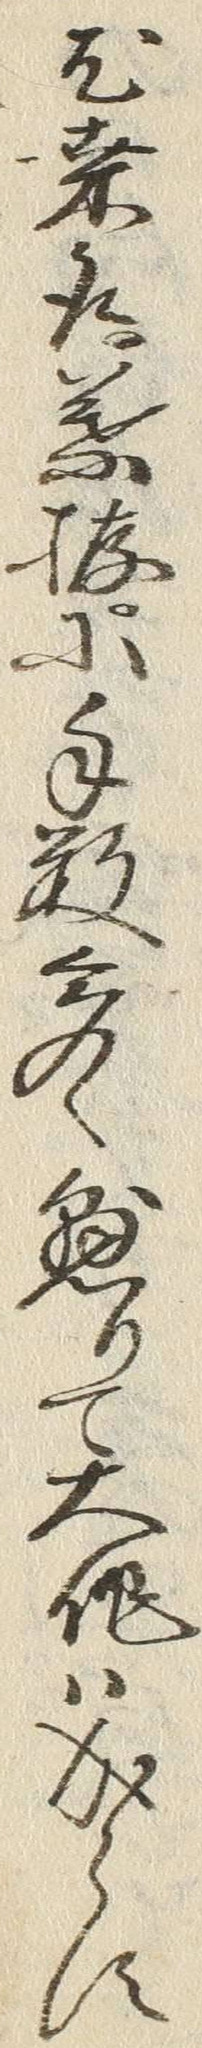尤桑取。葉拵。尓手数多く懸りて大作は成ら須
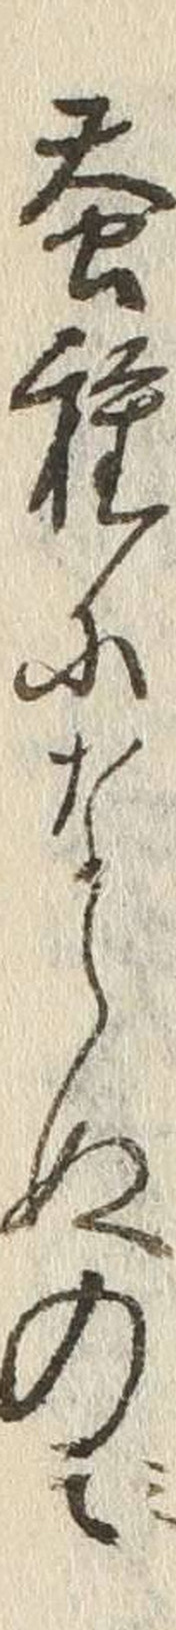蚕種尓ならぬのみ
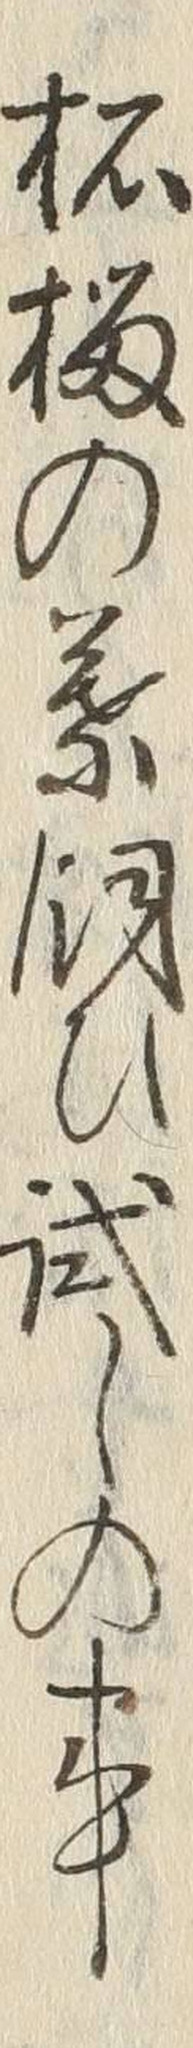柘榴の葉飼ひ試しの事
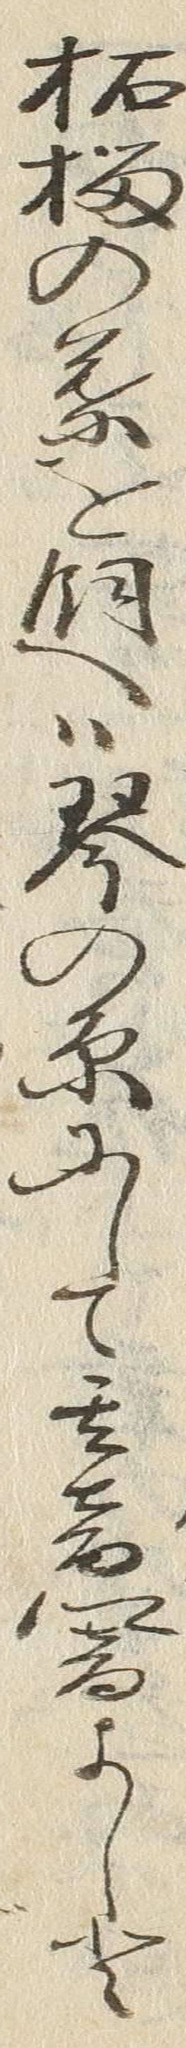柘榴の葉を飼へは琴の糸尓して其音響よし登
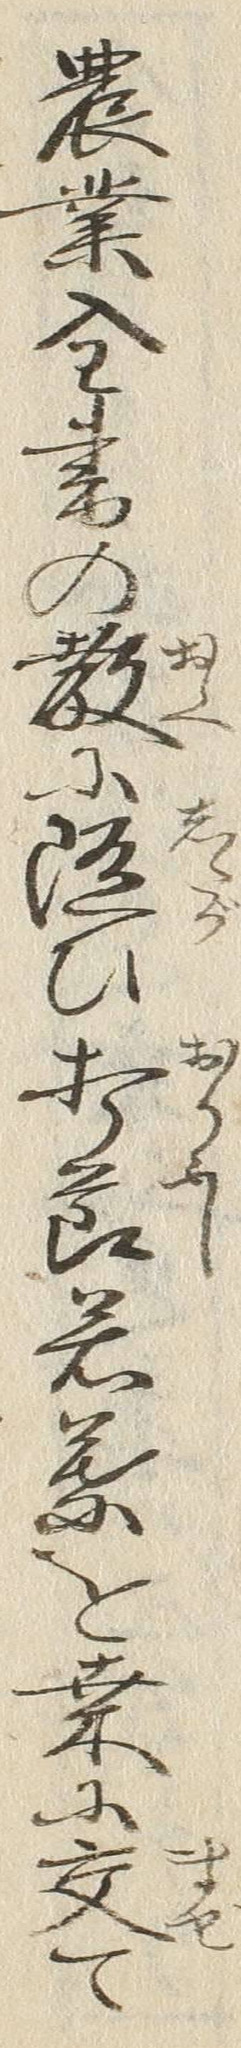農業全書の教尓随ひ折節若葉を桑尓交て
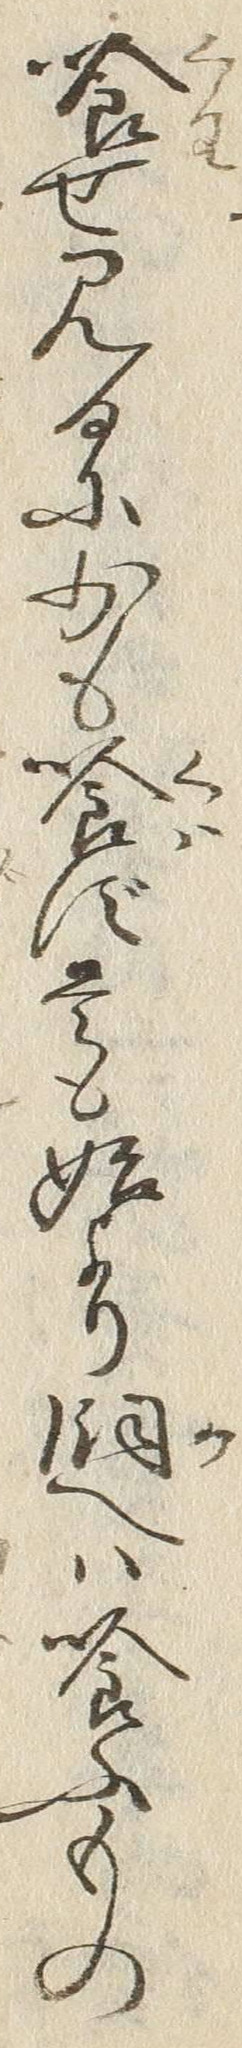喰せ見る尓少も喰ず是も始より飼へは喰ふもの
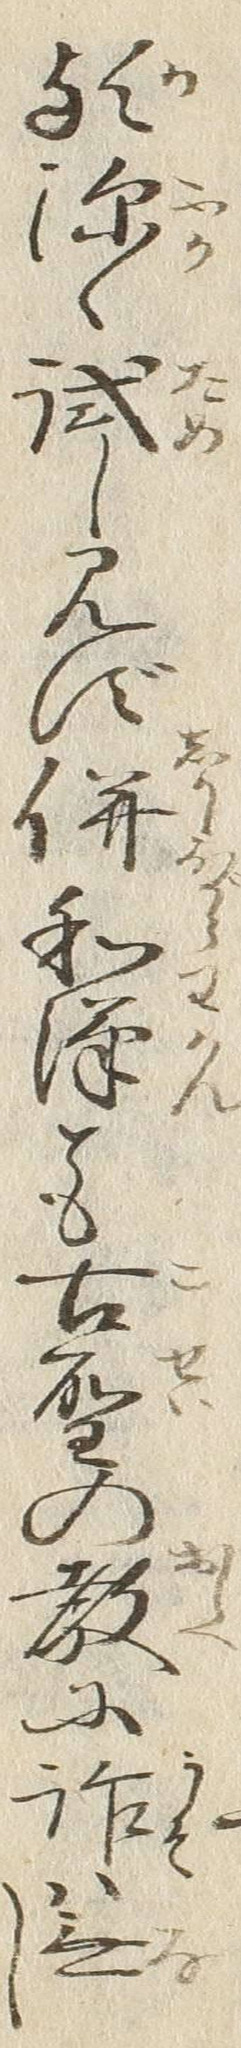歟深く試し見ず併和漢とも古聖の教尓詐は無し
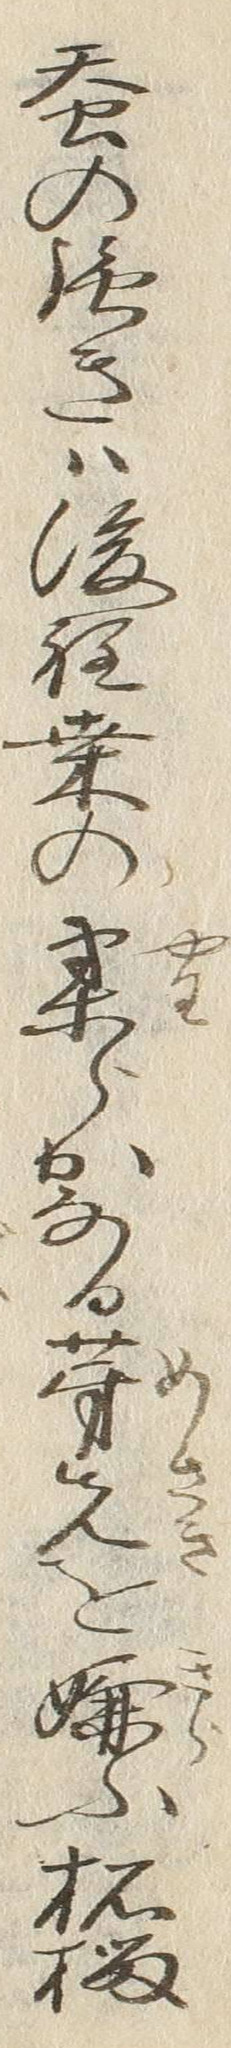蚕の強きは後程桑の柔らかなる芽先を嫌ふ柘榴
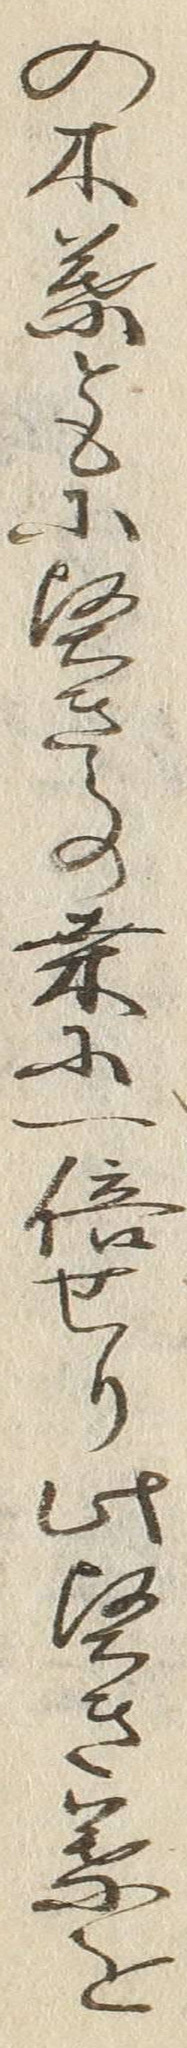の木葉とも尓堅き事桑尓一倍せり此堅き葉を
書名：養蠶實驗録後編
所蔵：東京大学農学生命科学図書館 国文学研究資料館
